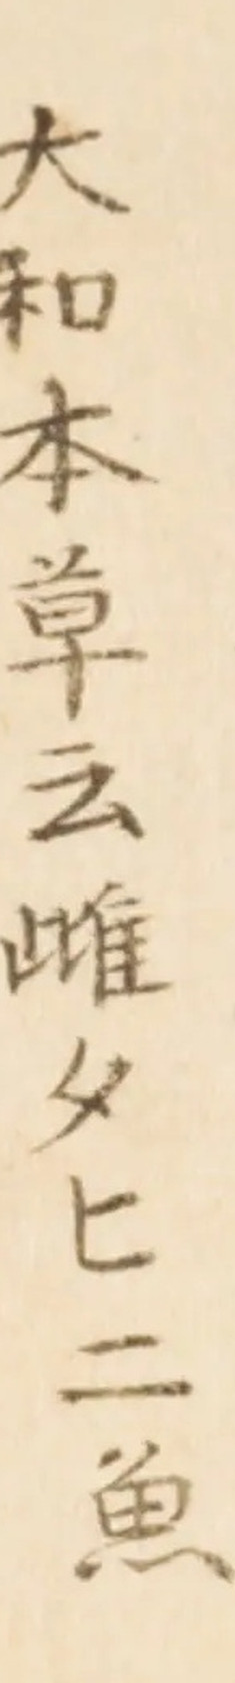大和本草云雌夕ヒ二魚

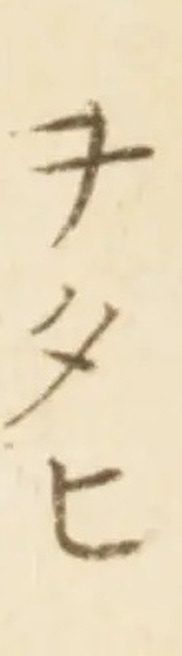ヲタヒ
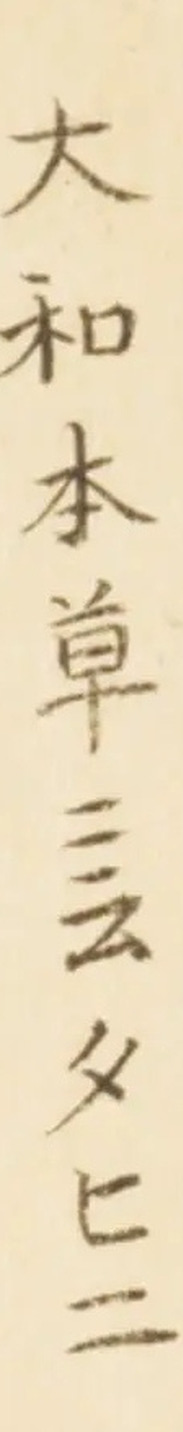大和本草ニ云タヒニ
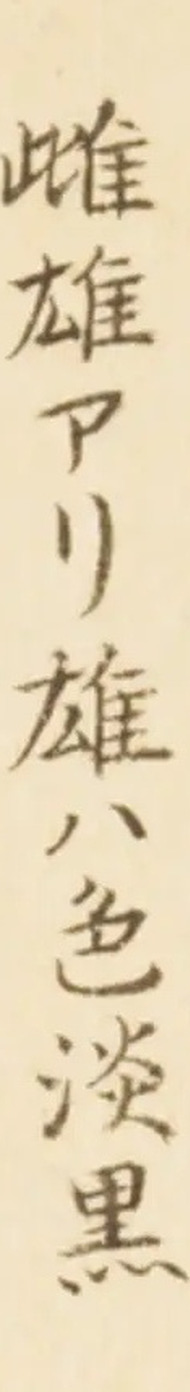雌雄アリ雄ハ色淡黒
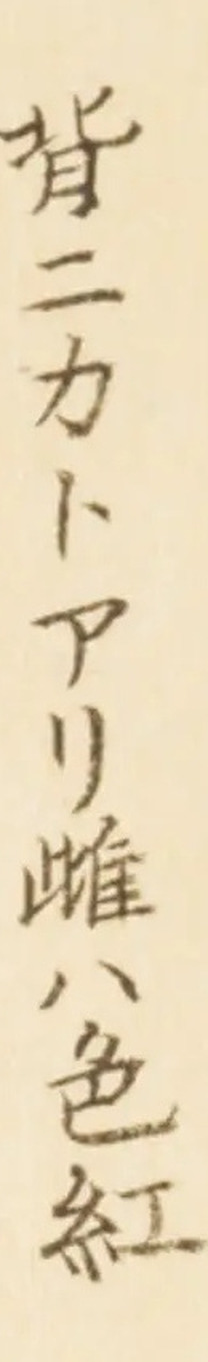背ニカトアリ雌は色紅
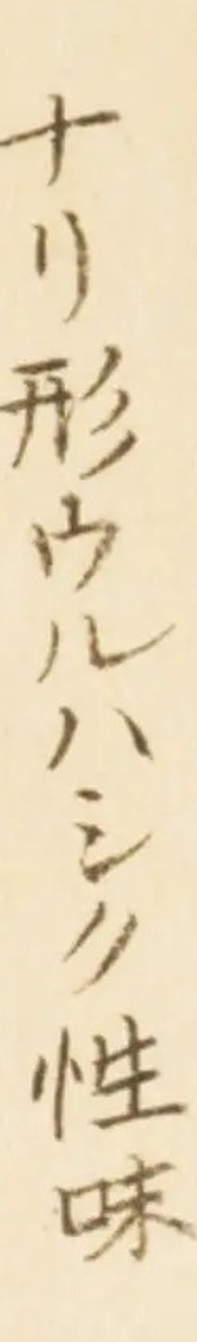ナリ形ウルハシク性味
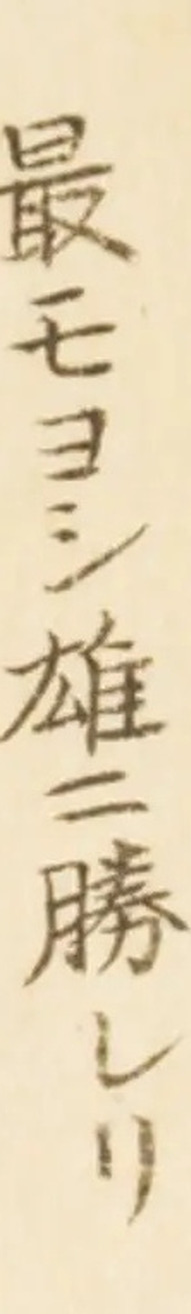最モヨシ雄ニ勝レリ
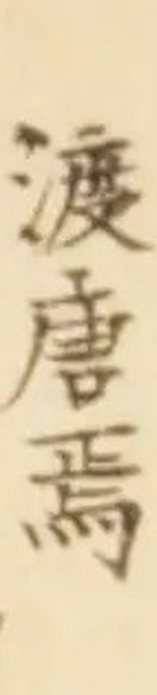渡唐焉

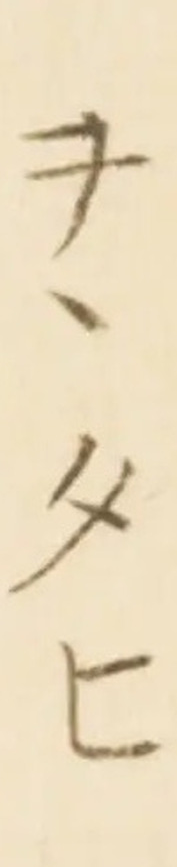ヲヽタヒ
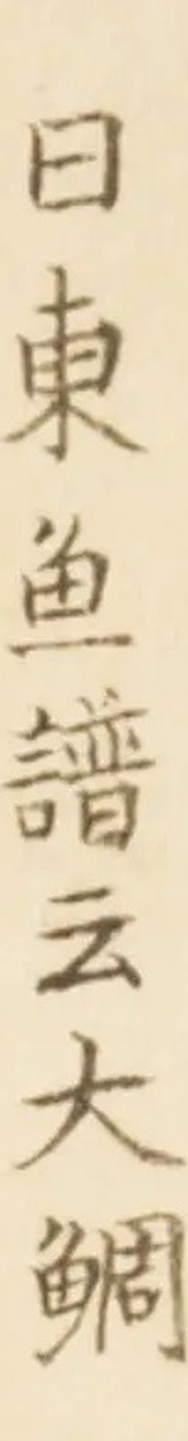日東魚譜云大鯛
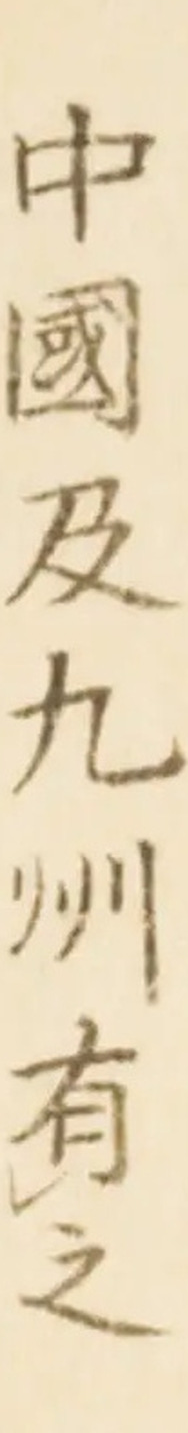中国及九州有之
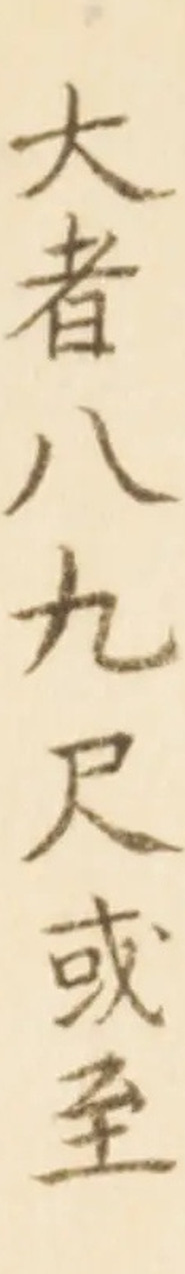大者八九尺或至
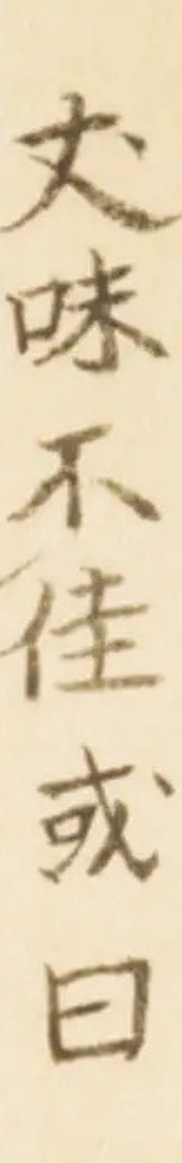丈味不佳或曰

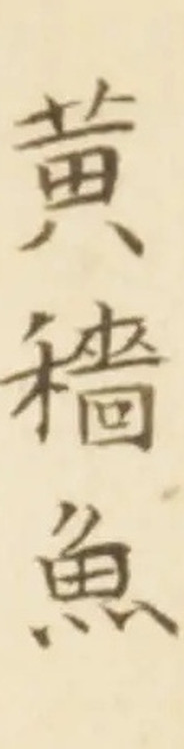黄檣魚
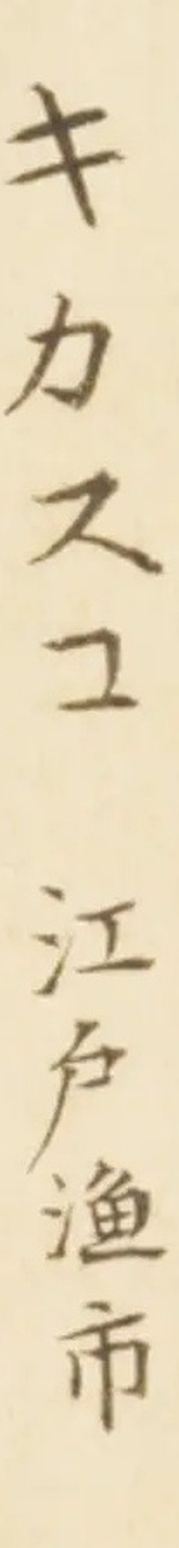キカスコ江戸漁市
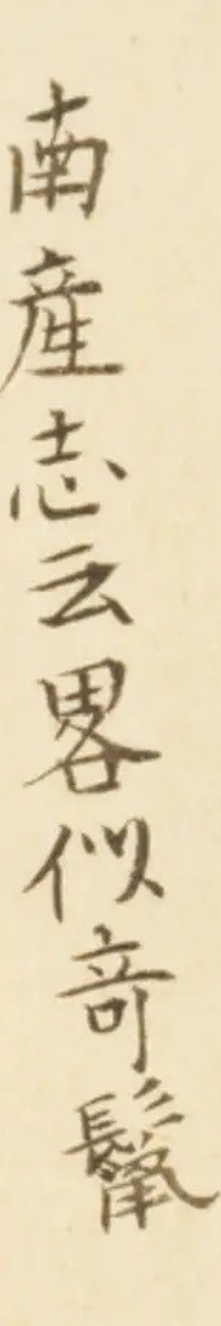南産志云略似奇鬣
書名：水族四帖. 夏
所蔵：国立国会図書館 National Diet Library, JAPAN
